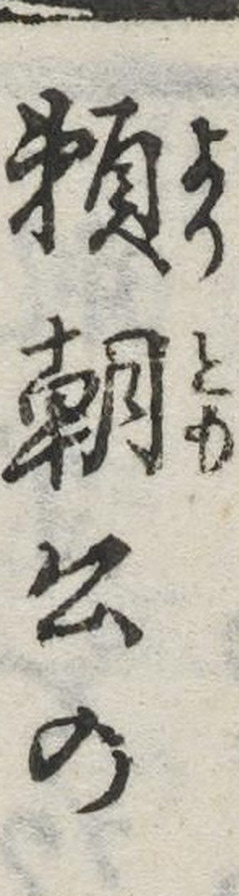頼朝公の
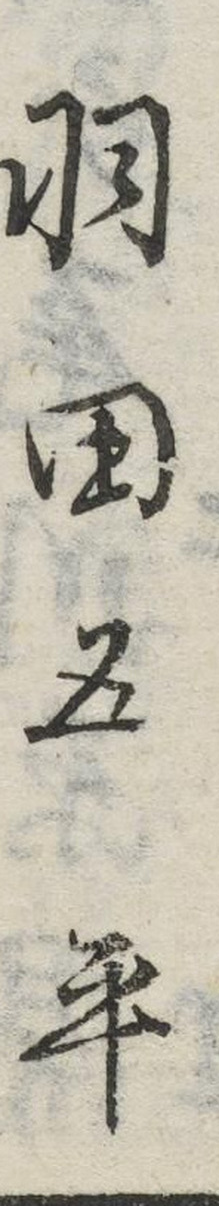羽田五平
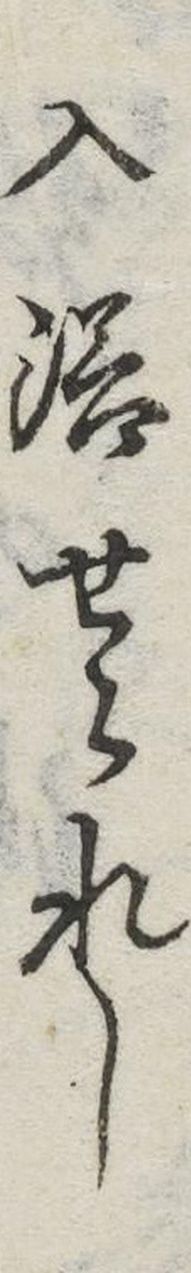入浴せられし
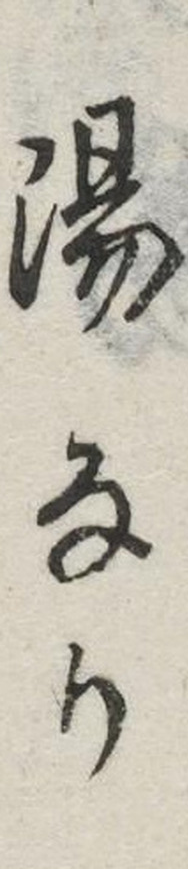湯なり
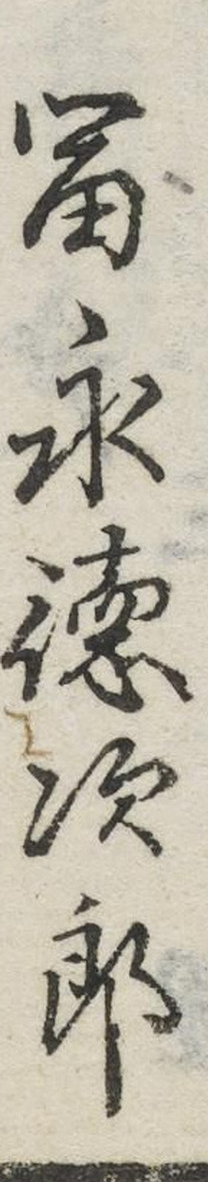冨永徳次郎
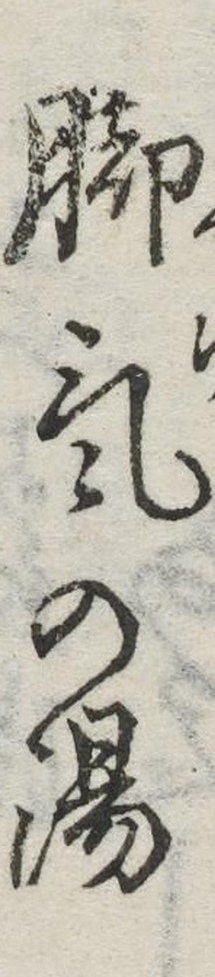脚気の湯
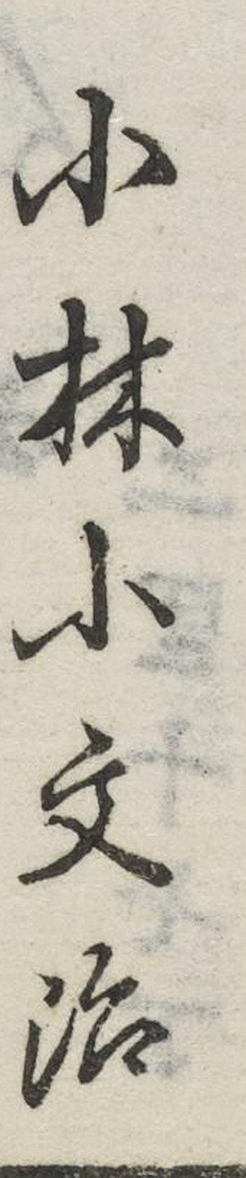小林小文治
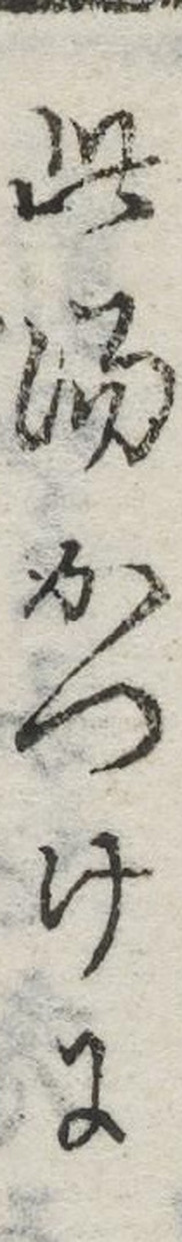此湯かつけに
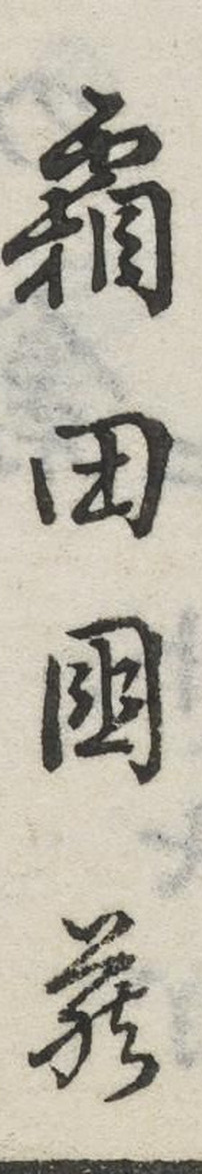霜田國蔵
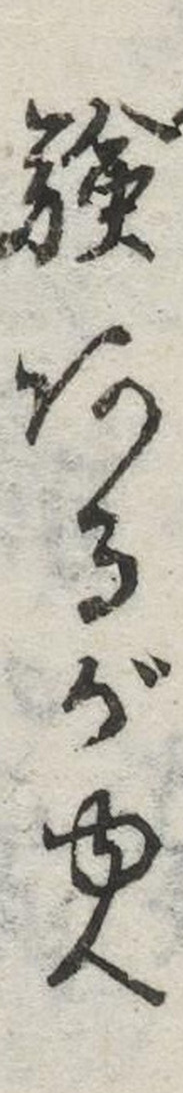験あるがゆへ
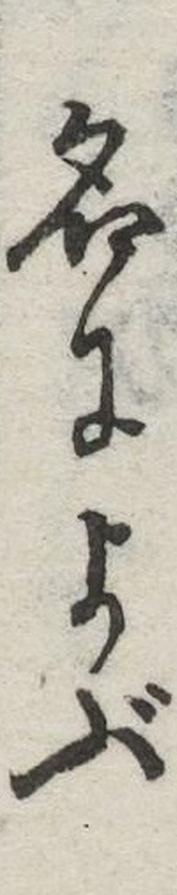名によぶ
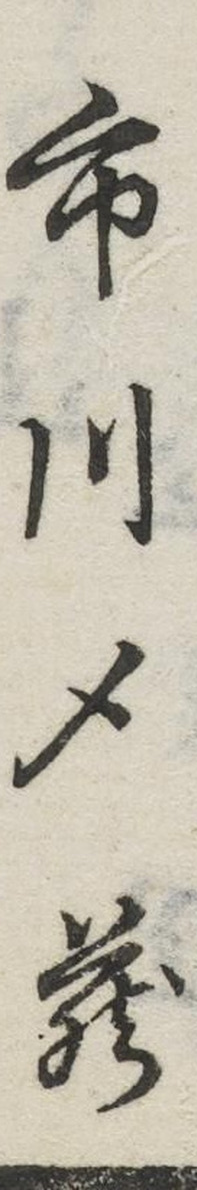市川貫蔵
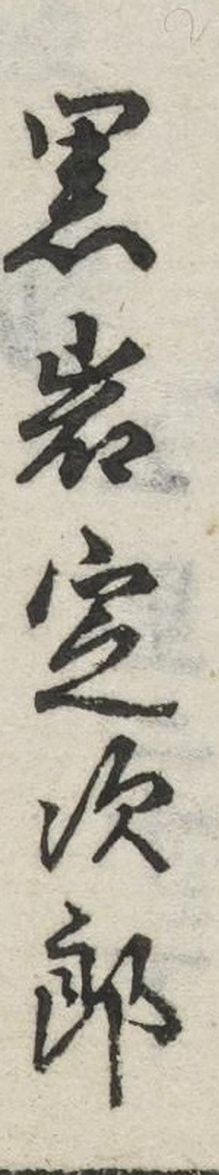黒岩定次郎
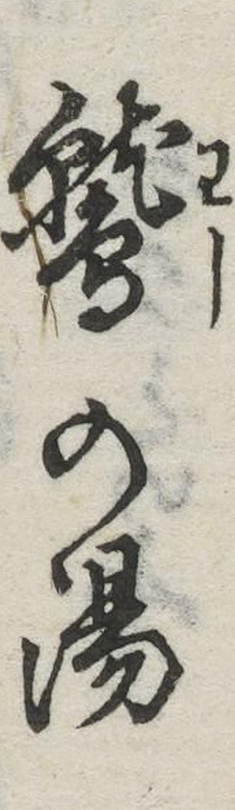鷲の湯
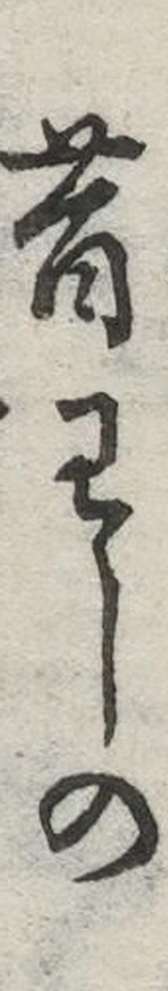昔わしの
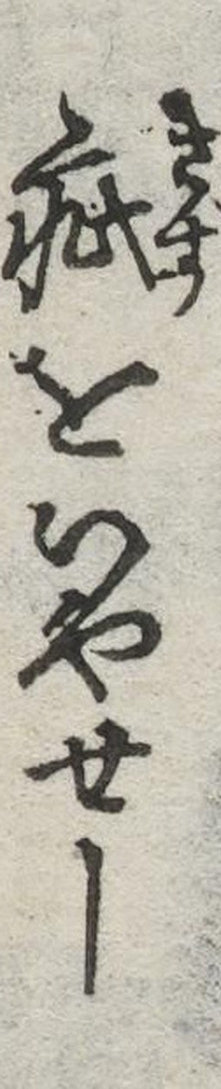疵をいやせし
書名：諸國温泉遊覽記　全
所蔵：東京大学地震研究所図書室 Earthquake Research Institute Library, The University of Tokyo, JAPAN
